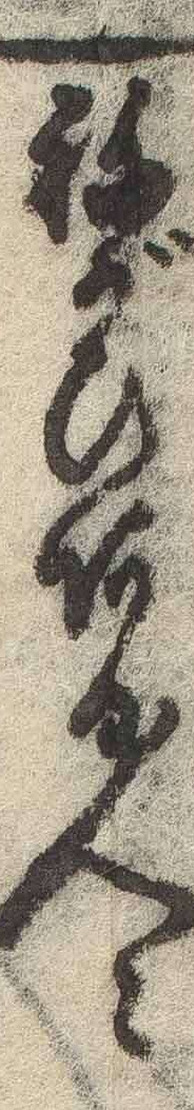ねがひある人々
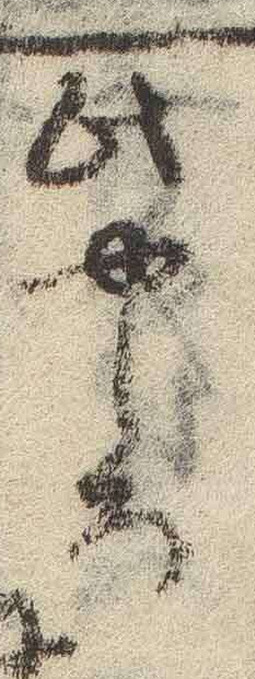此やしろに
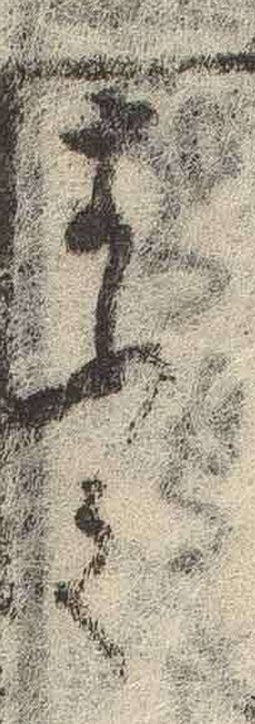まふて
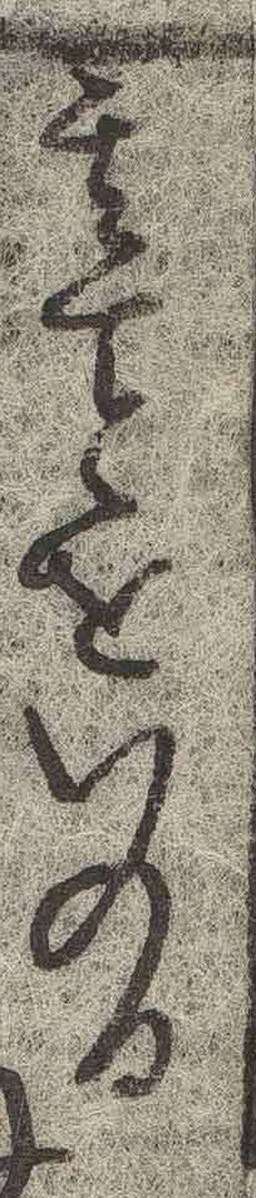其ことをいのるに
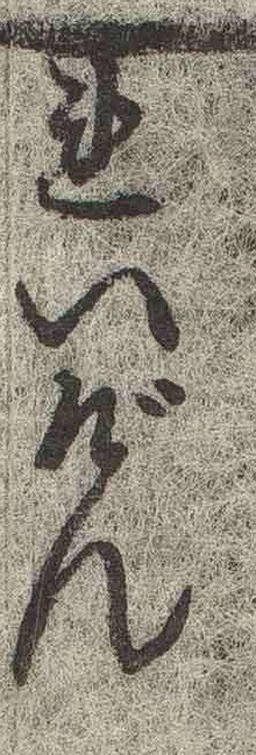れいげん
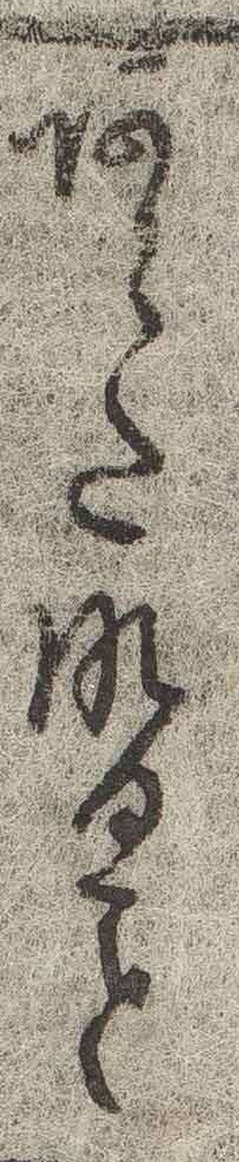あらたなること
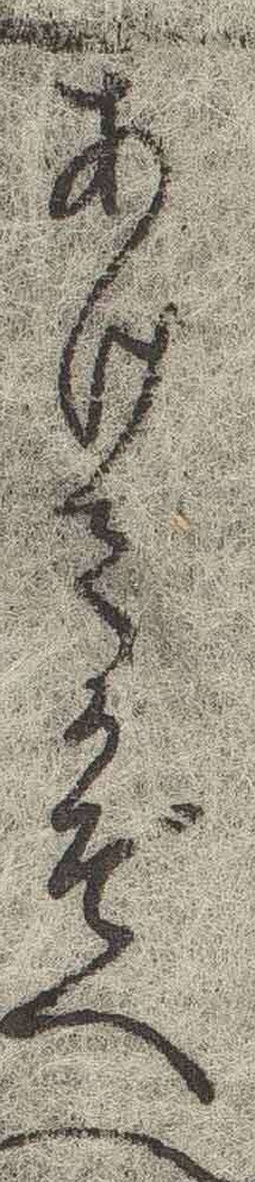あけてかぞへ
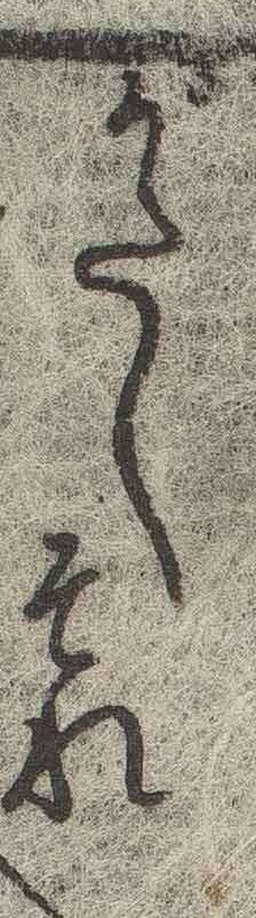がたしそれ
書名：末広扇
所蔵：東京学芸大学附属図書館 国文学研究資料館
